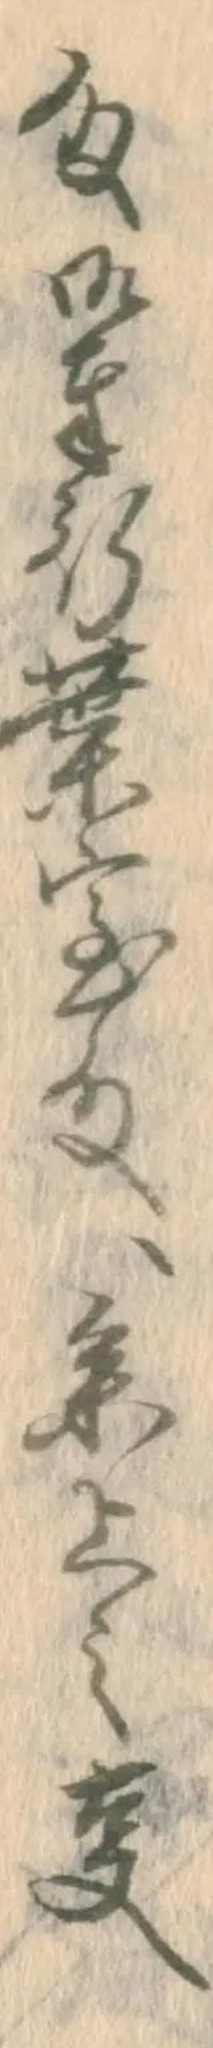殿御奉行葉宝殿へ参上之事
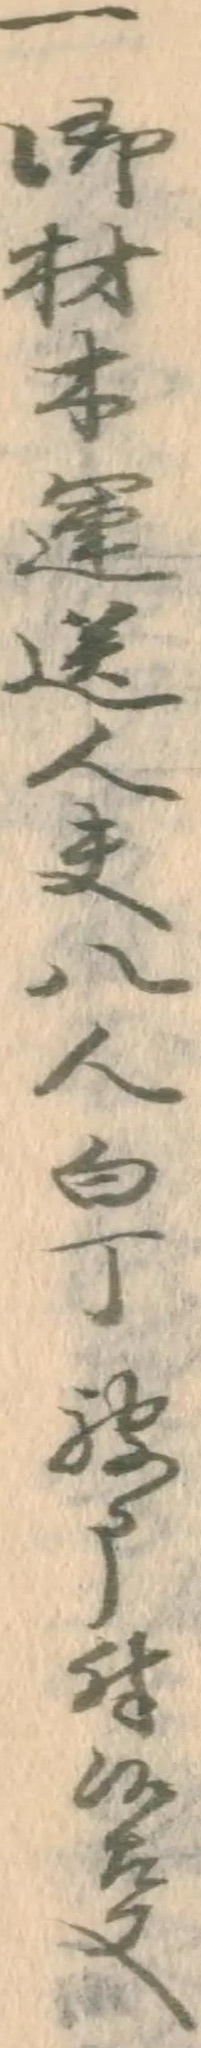一御材木運送人夫八人白丁被申付候事
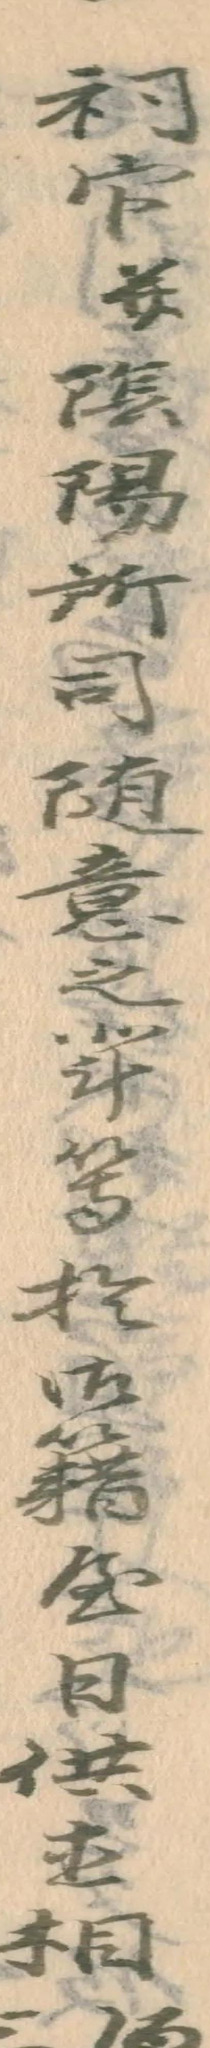一祠官并陰陽所司随意之輩等於御籍屋日供直相酒三
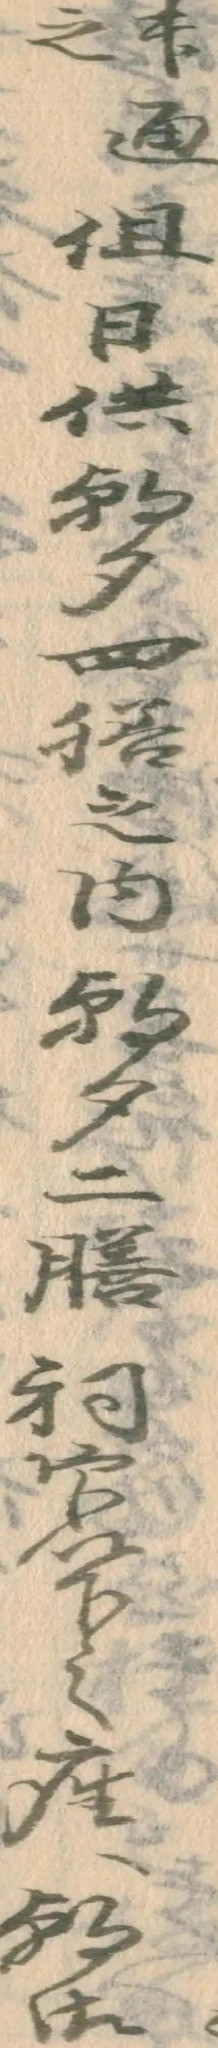升通之但日供朝夕四膳之内朝夕二膳祠官以下之座へ朝御
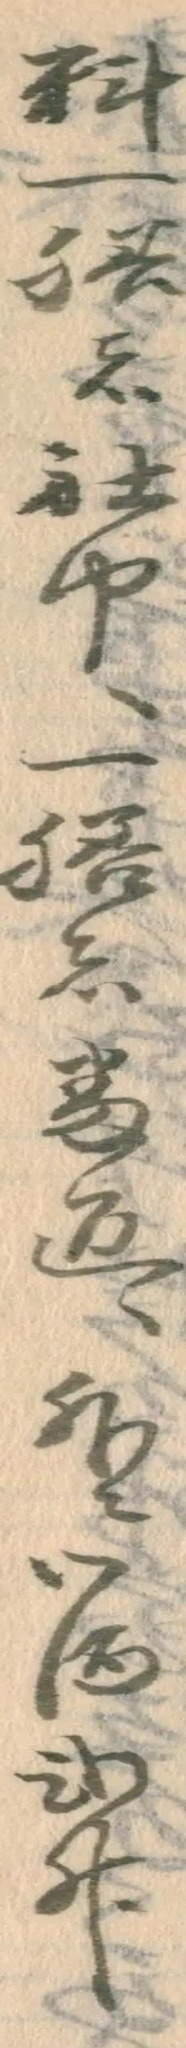料一膳は社中へ一膳は番辺へ外ニ御酒弐升
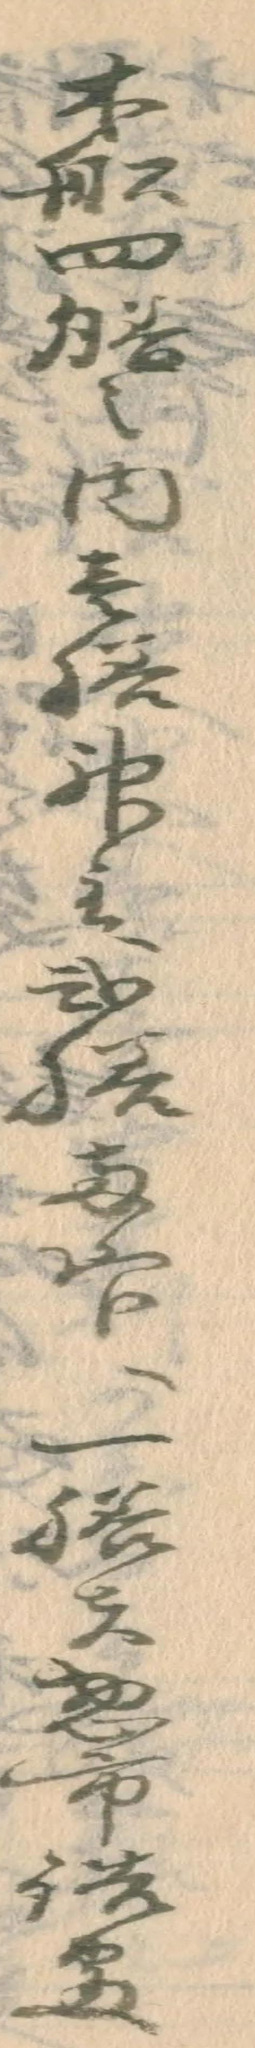一木船四膳之内壱膳神主へ弐膳両官へ一膳は惣市詰番
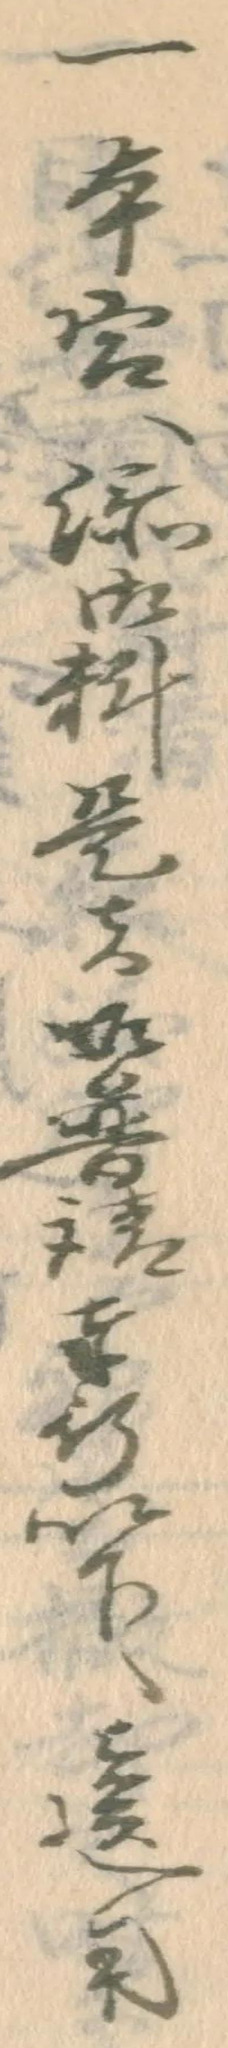一本宮へ添御料是は御普請奉行以下へ被送用
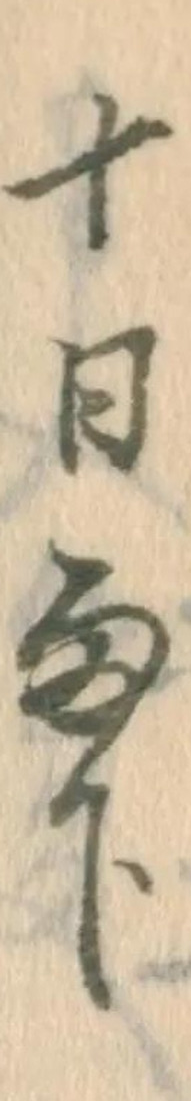十日雨下
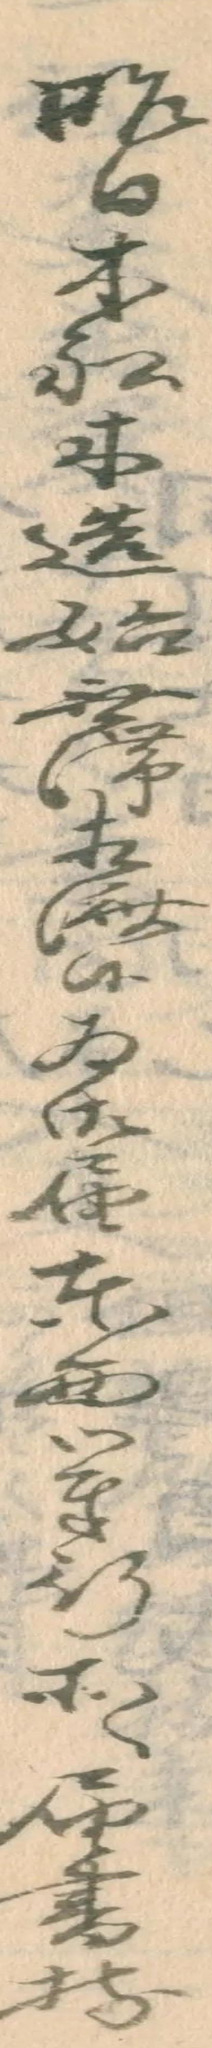一昨日木船木造始無滞相済候為御届東西御奉行所へ届書持
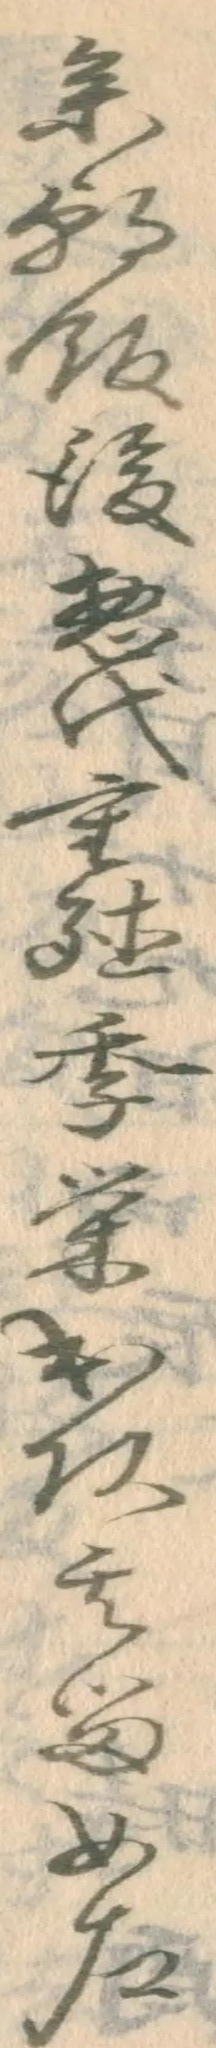参朝飯後惣代重殖季栄出頭其留如左
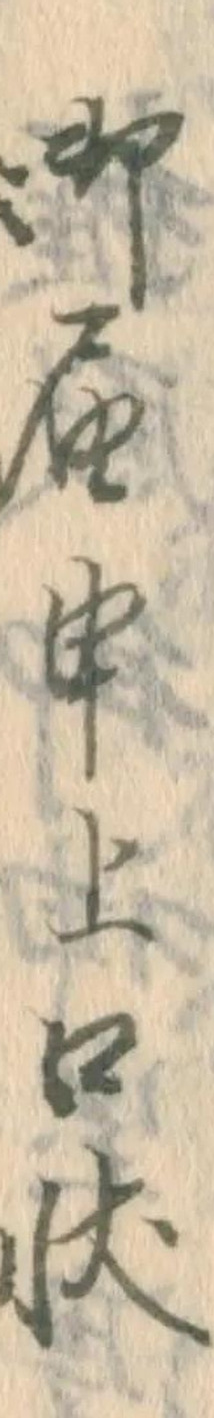御届申上口状
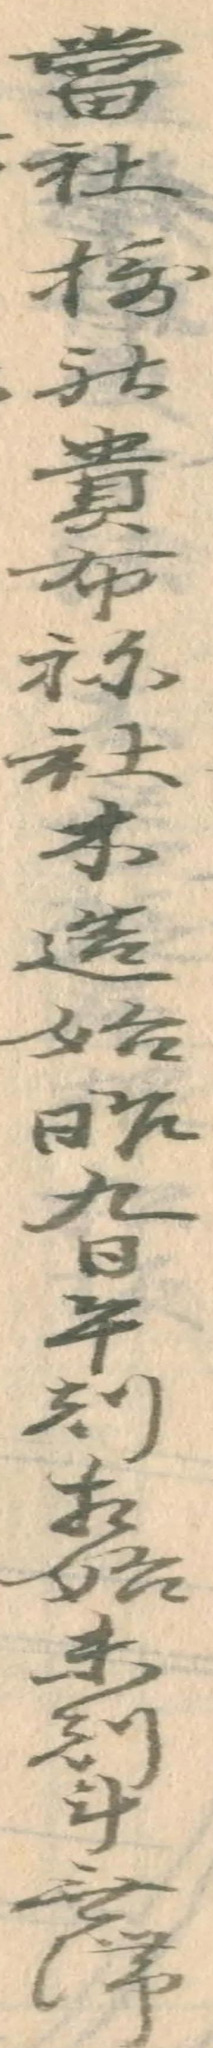当社摂社貴布祢社木造始昨九日午刻相始未刻計無滞
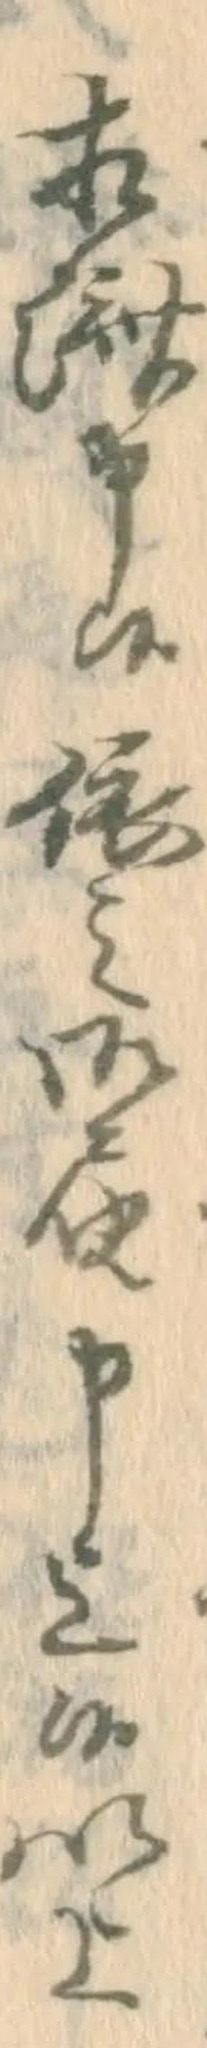相済申候依之御届申上候以上
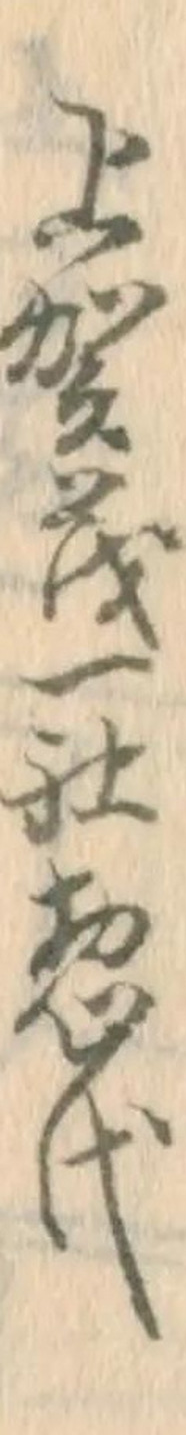上賀茂一社惣代
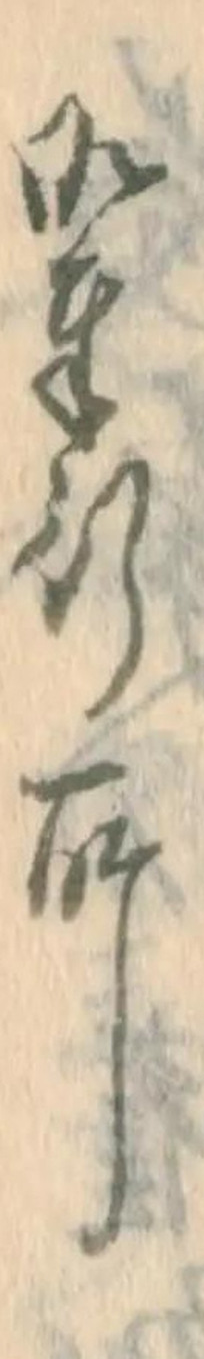御奉行所
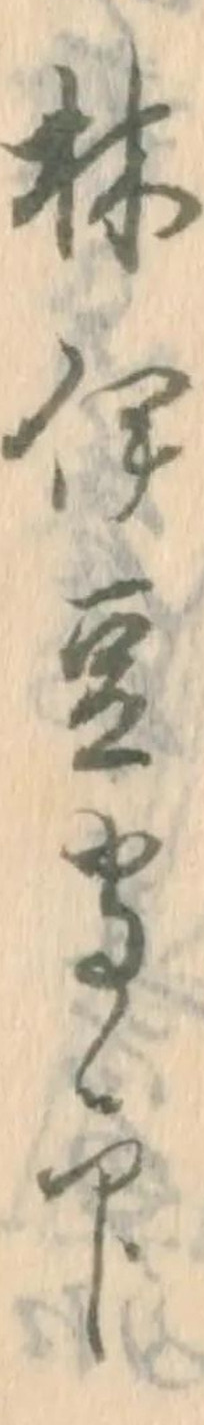林伊豆守印
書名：賀茂社記録. 第17冊
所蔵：国立国会図書館 National Diet Library, JAPAN
